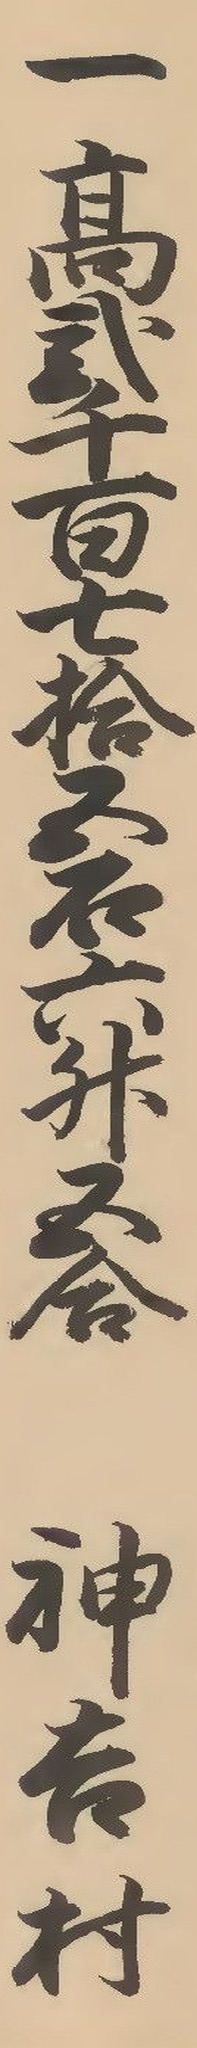一髙弐千百七拾五石六升五合神吉村
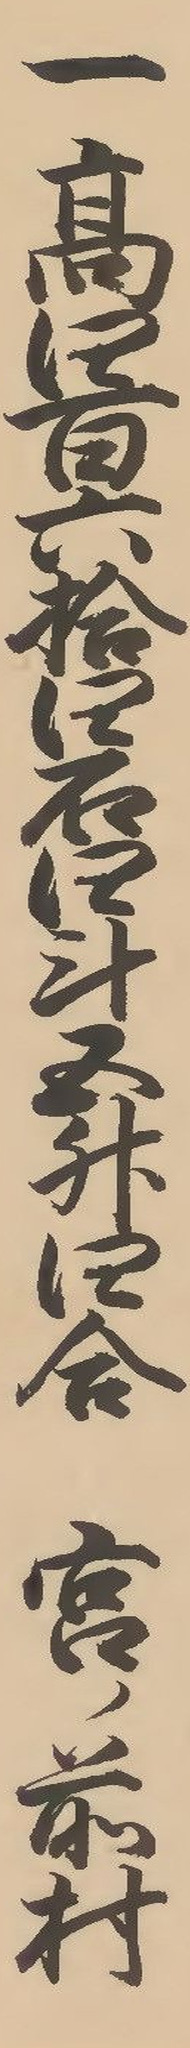一髙四百六拾四石四斗五升四合宮ノ前村

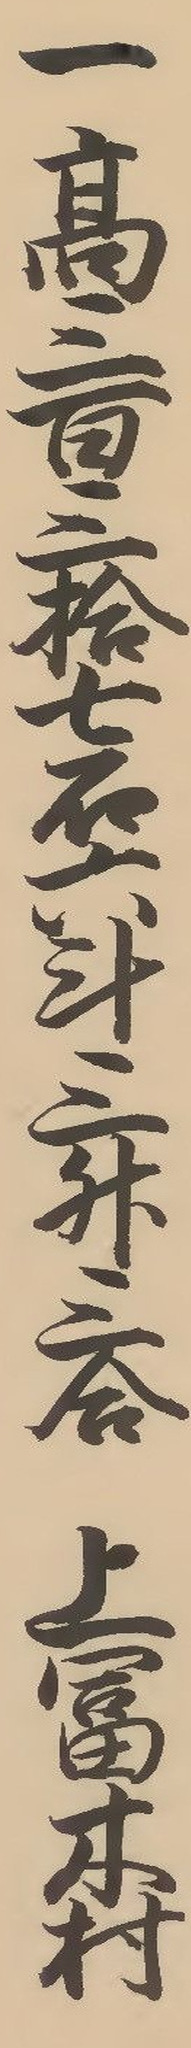一髙三百三拾七石六斗三升三合上冨木村
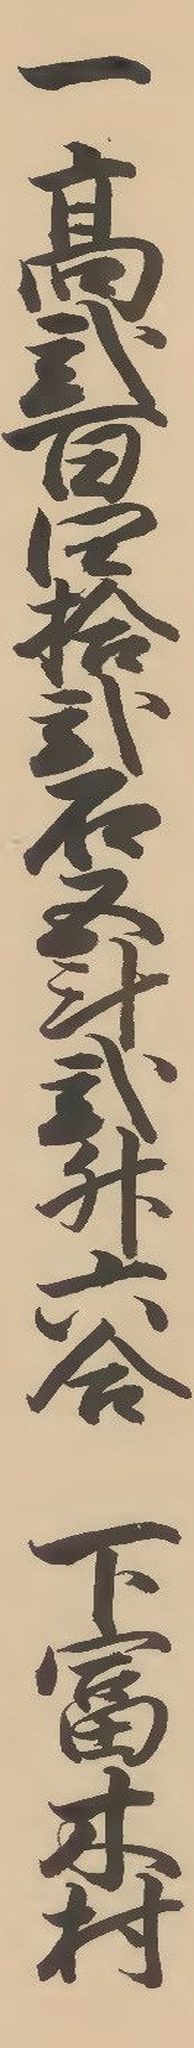一髙弐百四拾弐石五斗弐升六合下冨木村
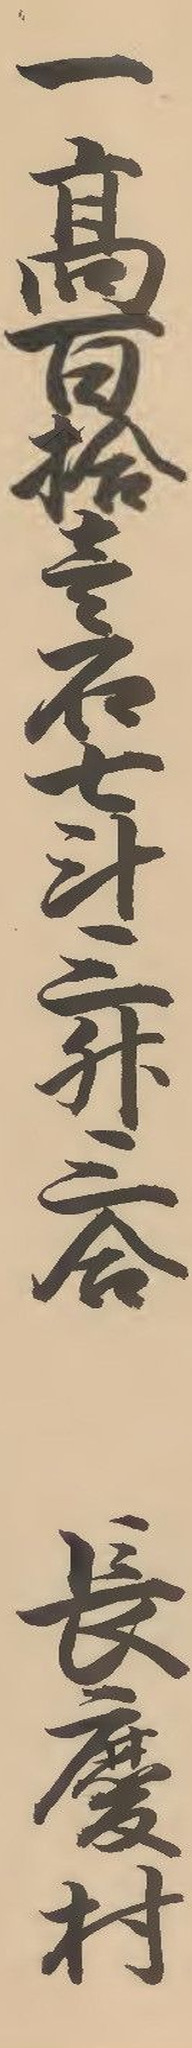一髙百拾壱石七斗三升三合長慶村
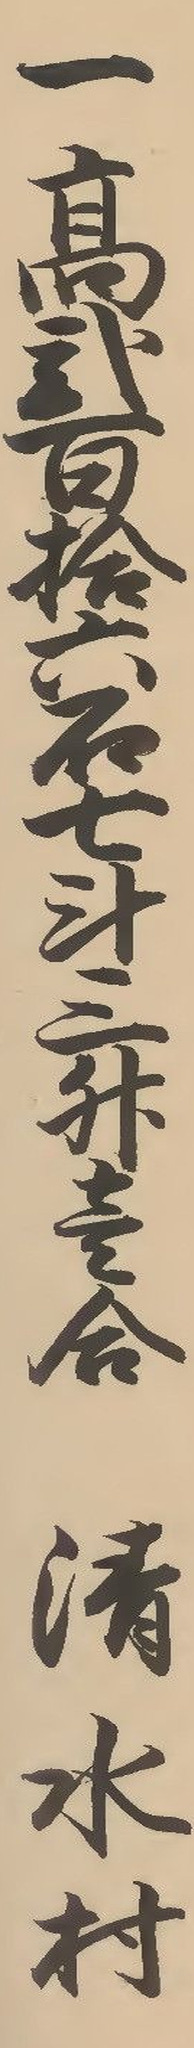一髙弐百拾六石七斗三升壱合清水村
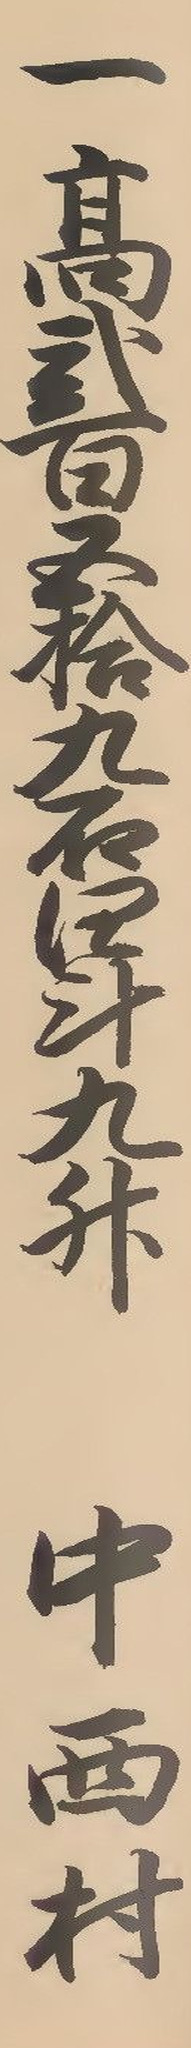一髙弐百五拾九石四斗九升中西村
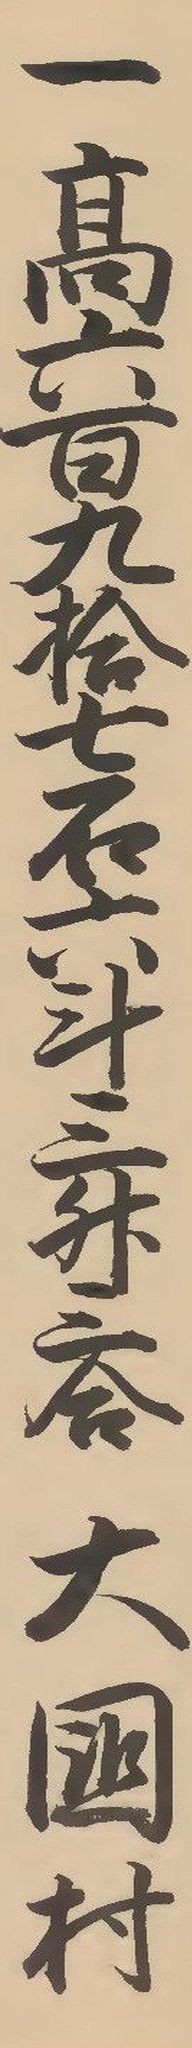一髙六百九拾七石六斗三升三合大國村
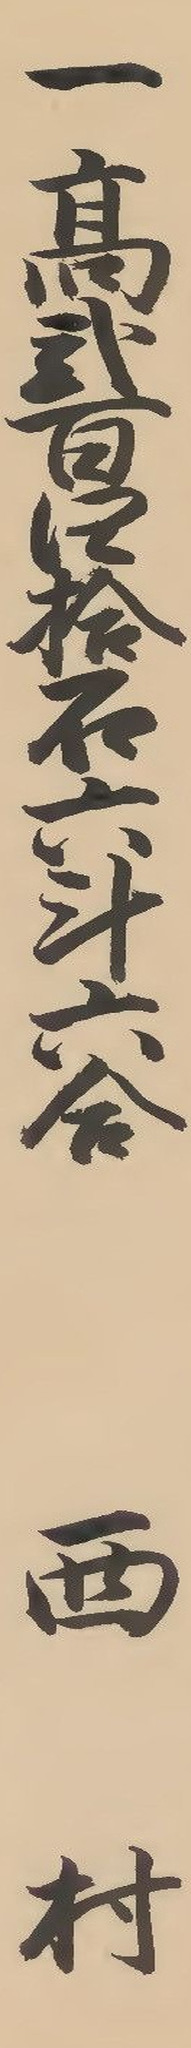一髙弐百四拾石六斗六合西村
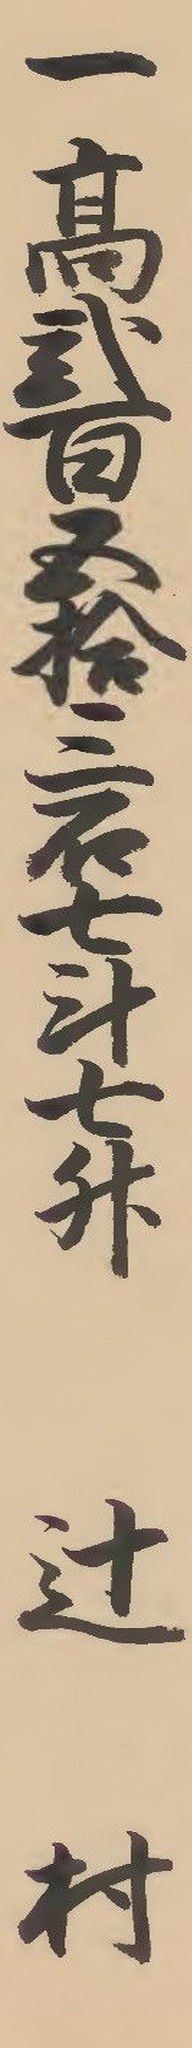一髙弐百五拾三石七斗七升辻村

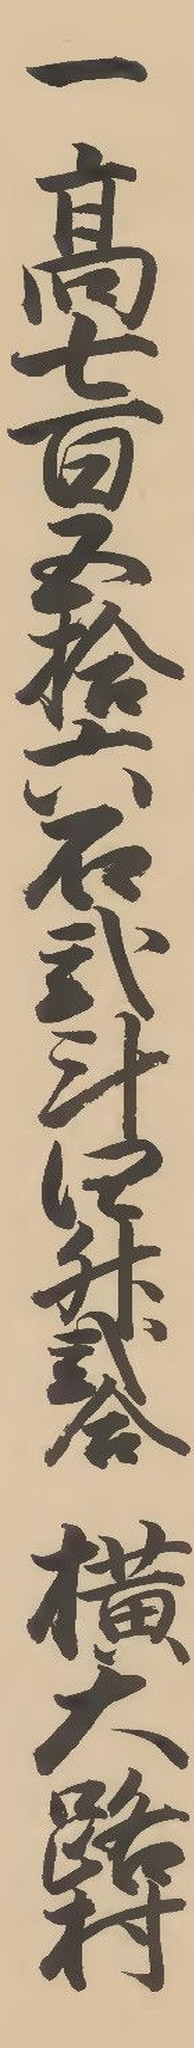一髙七百五拾六石弐斗四升弐合横大路村
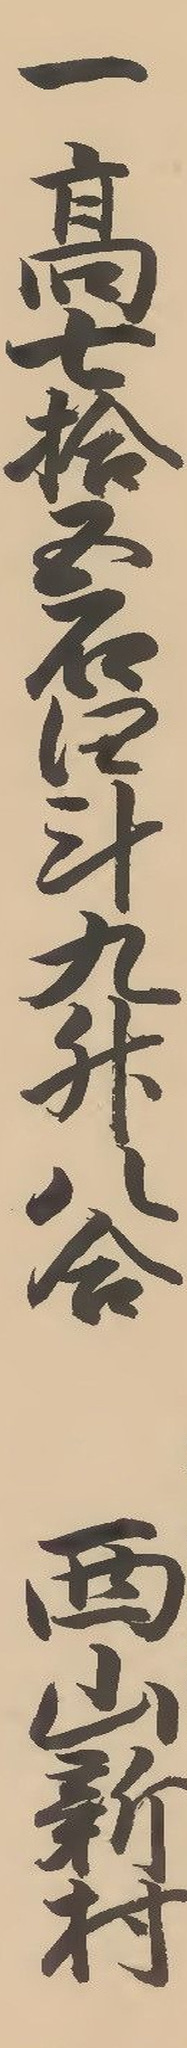一髙七拾五石四斗九升八合西山新村
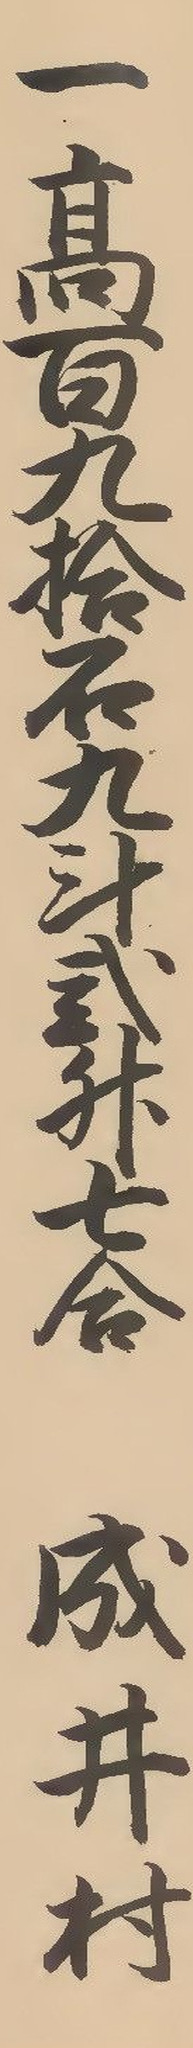一髙百九拾石九斗弐升七合成井村
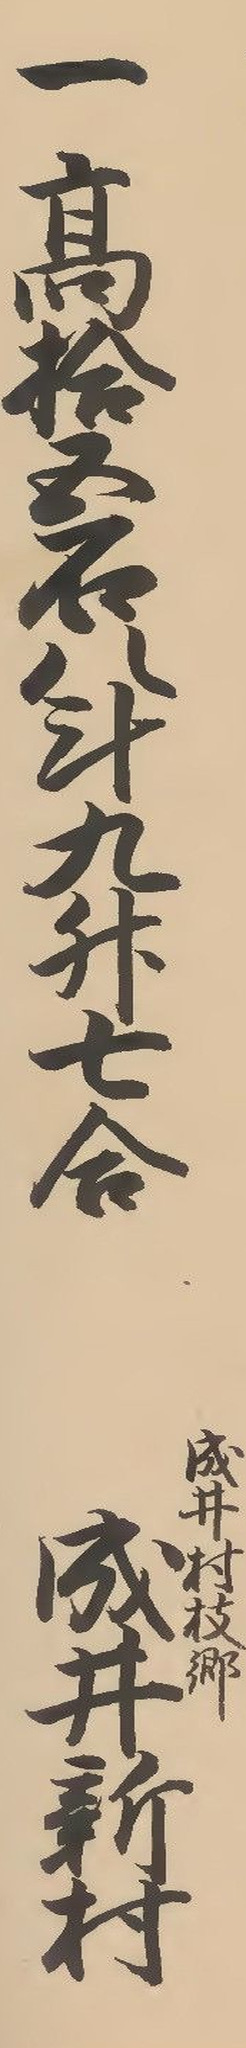一髙拾五石八斗九升七合成井新村
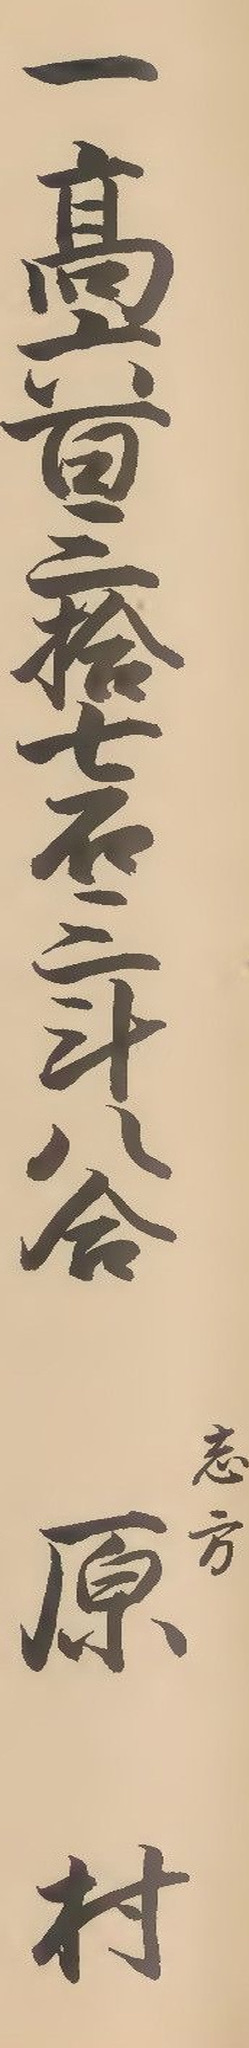一髙六百三拾七石三斗八合原村
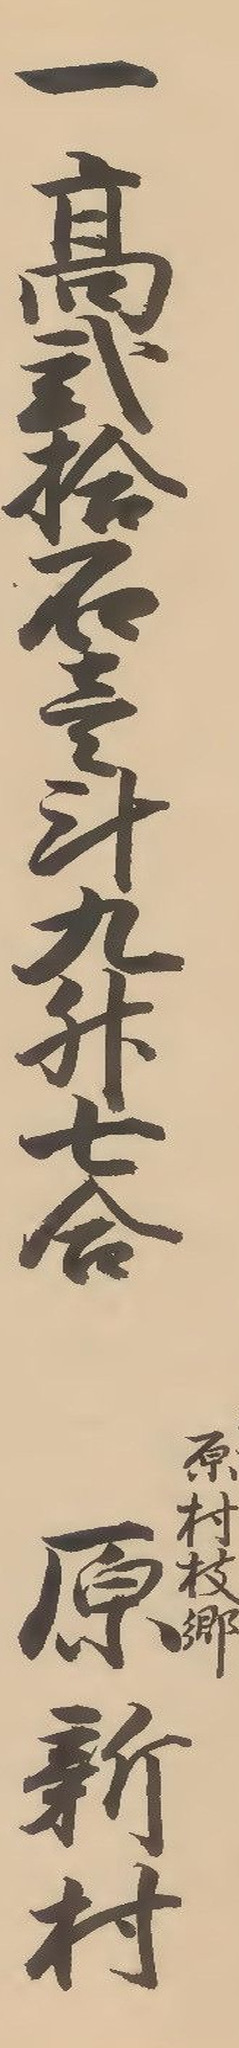一髙弐拾石壱斗九升七合原新村
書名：播磨国郷帳
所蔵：国立公文書館 National Archives of Japan
